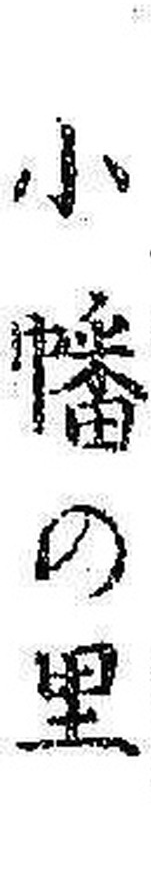小幡の里
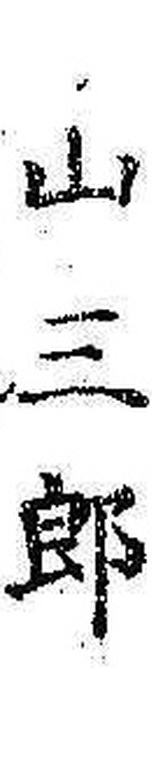山三郎
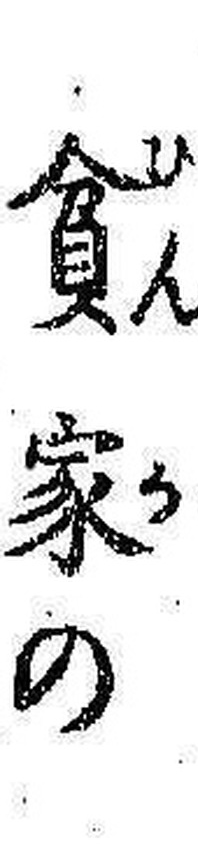貧家の
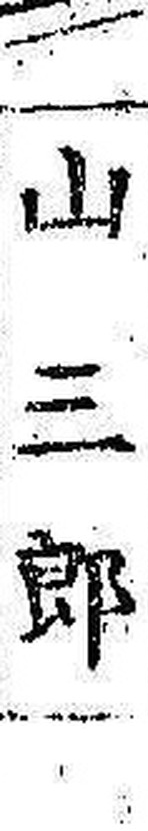山三郎

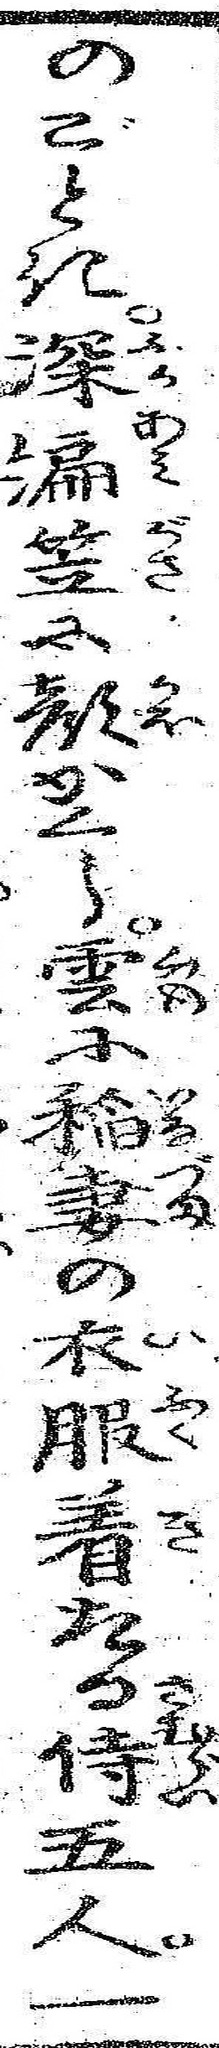のごとき。深編笠に顔かくし。雲に稲妻の衣服着たる侍五人。一
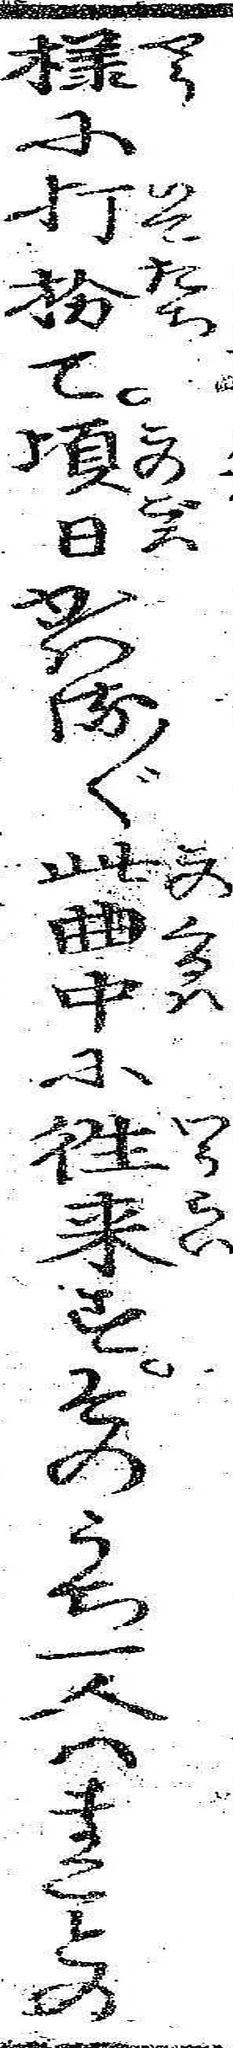様に打扮て。頃日かはる〴〵此曲中に往来す。そのうち一人はまことの
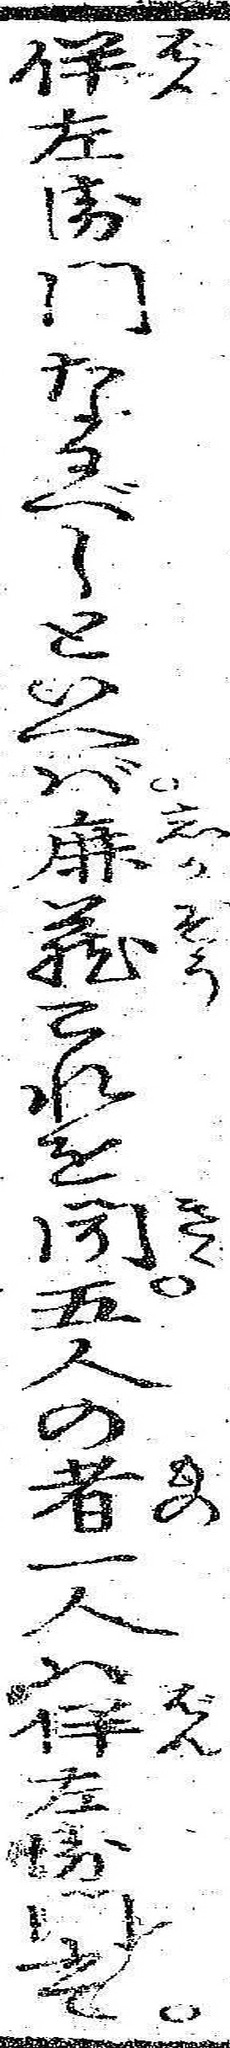伴左衛門なるべしといへば。鹿蔵これを聞。五人の者一人は伴左衛門にて。
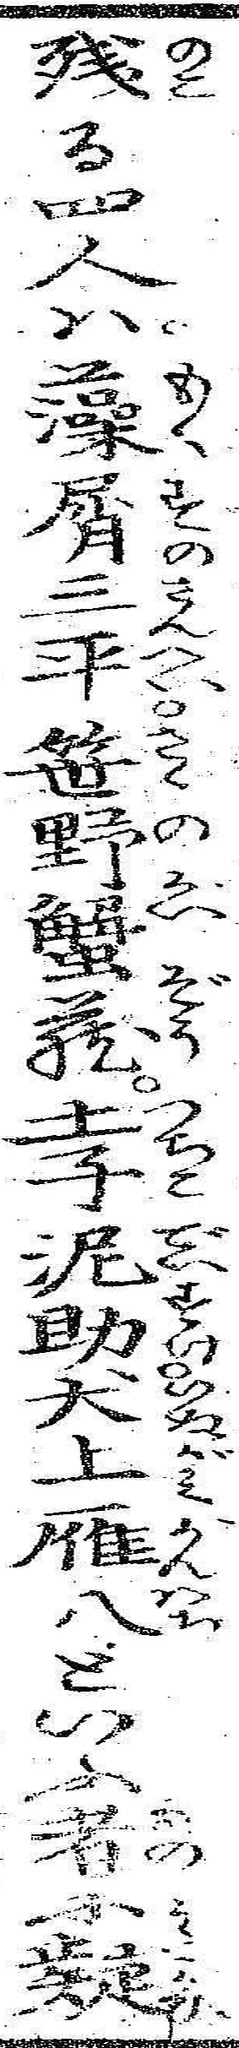残る四人は。藻屑三平。笹野蟹蔵。土子泥助。犬上雁八といふ者に疑
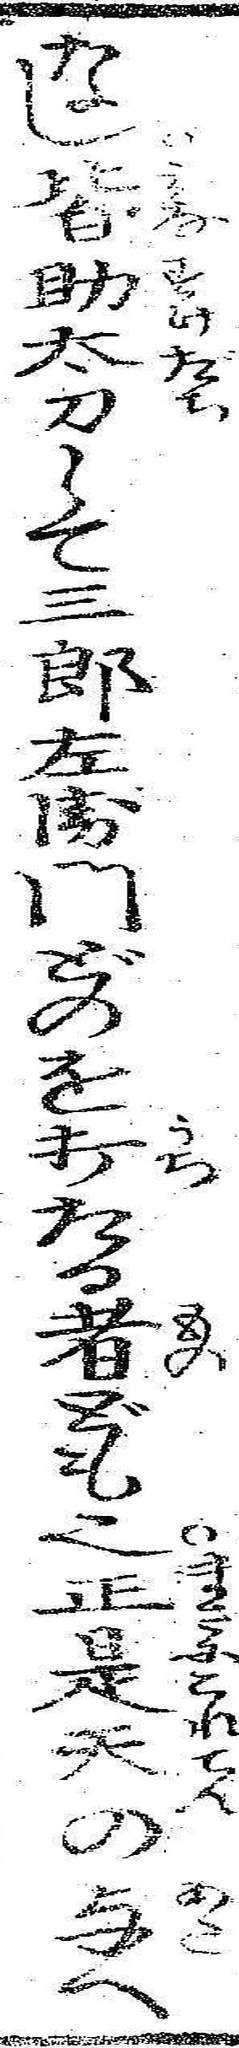なし。皆助太刀して三郎左衛門どのを打たる者ども也。正是天の与へ
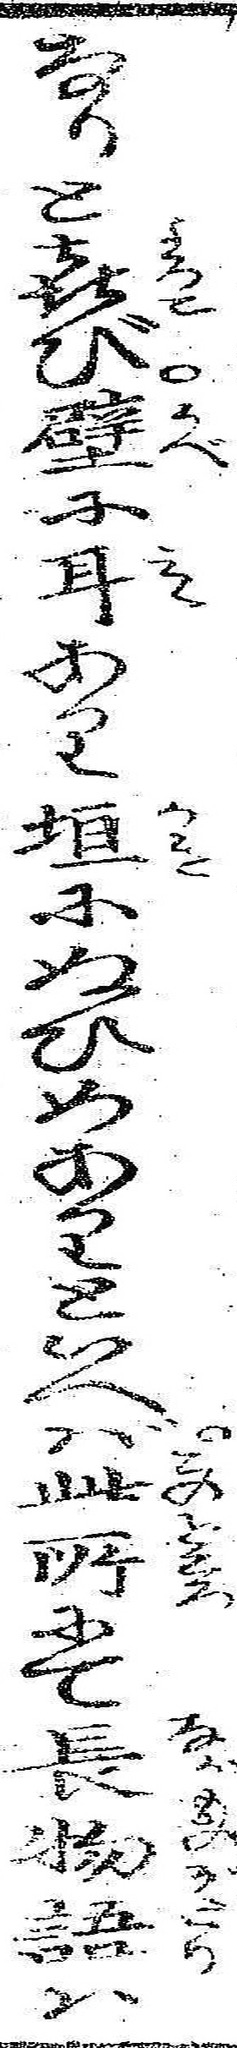なりと喜び。壁に耳あり垣にぬひめありといへば。此所にて長物語は
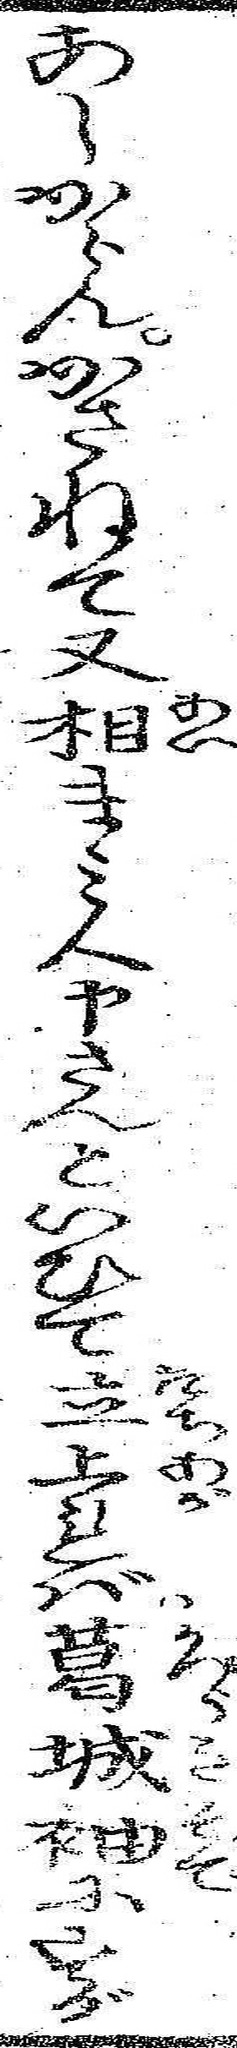あしからん。かさねて又相まみえ申さんといひて立上れば。葛城袖にすが
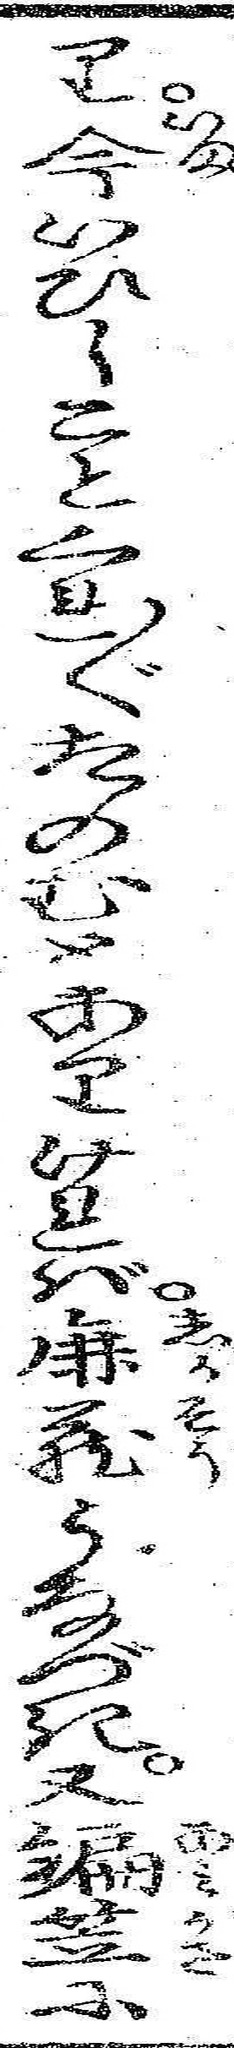り。今いひしことくれ〴〵たのむとありければ。鹿蔵うなづき。又編笠に
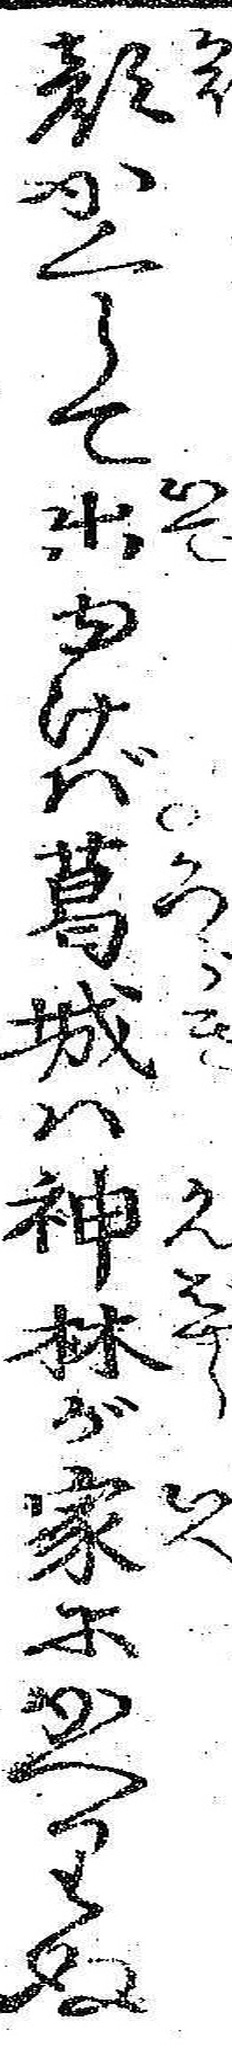顔かくして出ゆけば。葛城は神林が家にかへりぬ
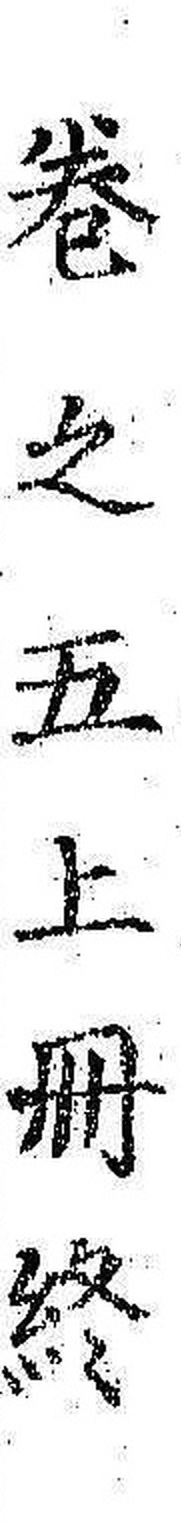巻之五上冊終

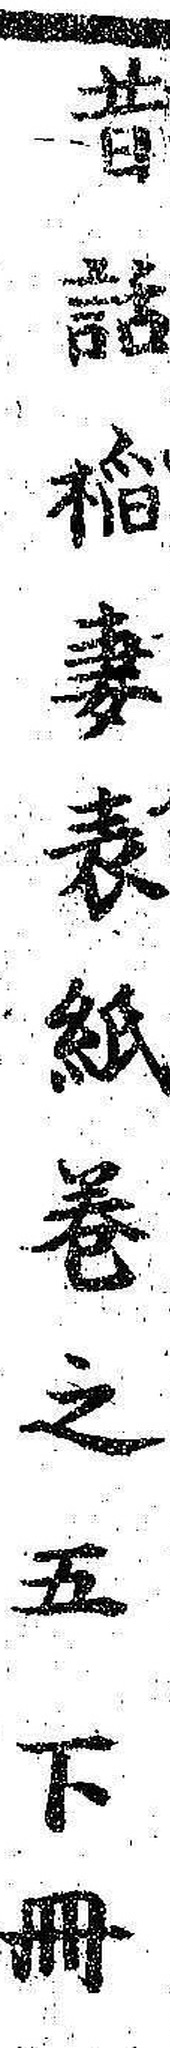昔話稲妻表紙巻之五下冊
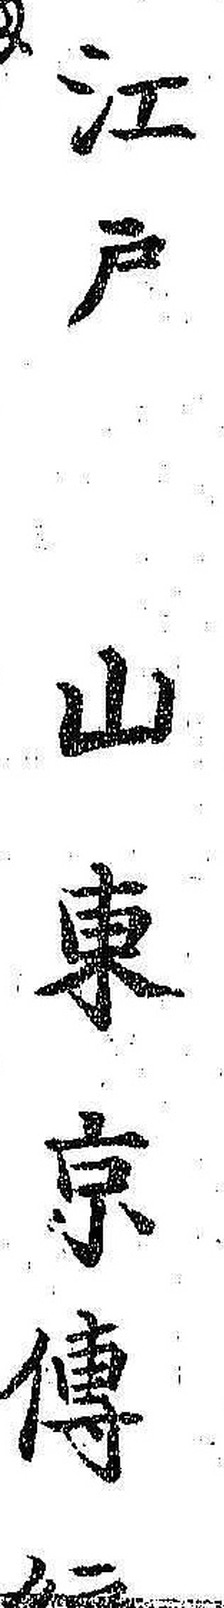江戸山東京伝編
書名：昔話稲妻表紙
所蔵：国文学研究資料館
